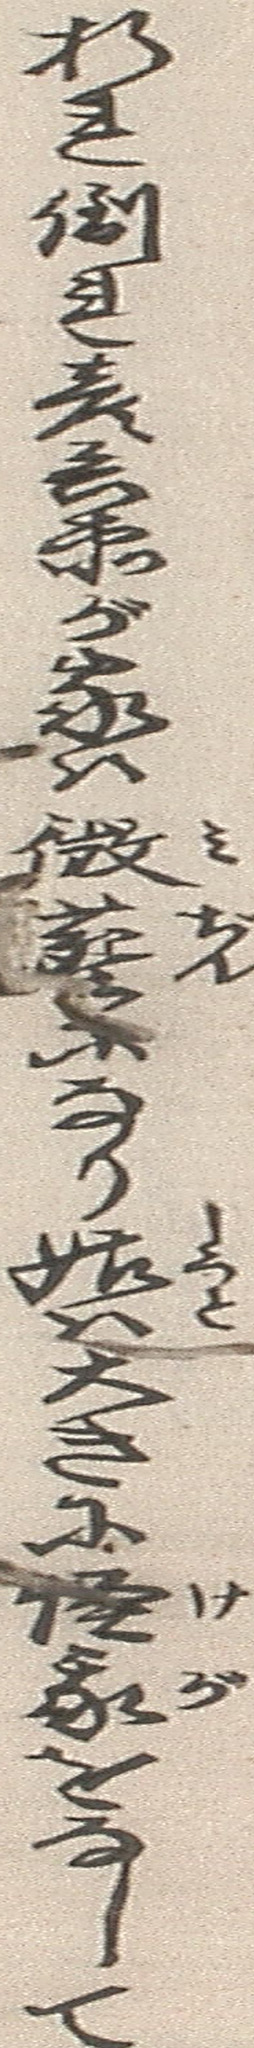折れ倒れ彦兵衛が家ハ微塵になり姑ハ大きに怪我をなして
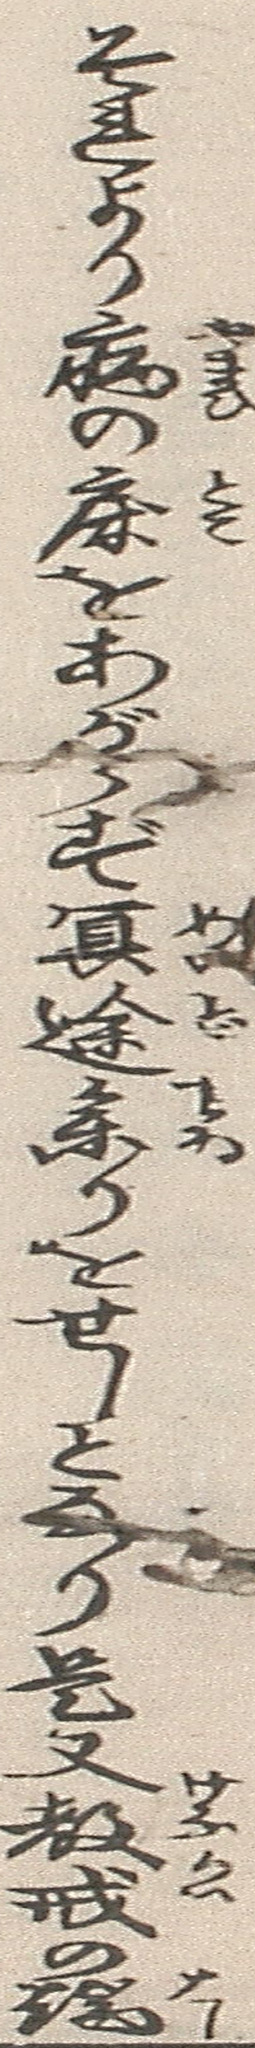それより病の床をあがらず冥途参りをせしとなり是又教戒の端
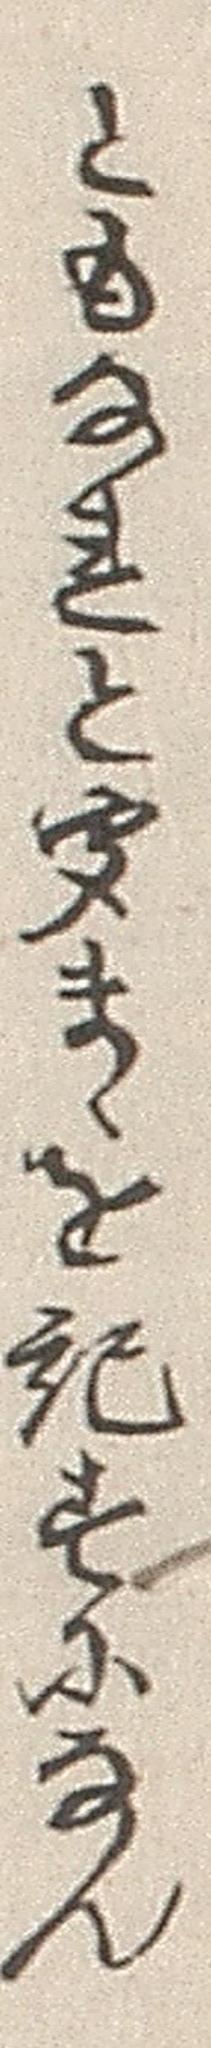ともなれと聞まゝを紀すになん
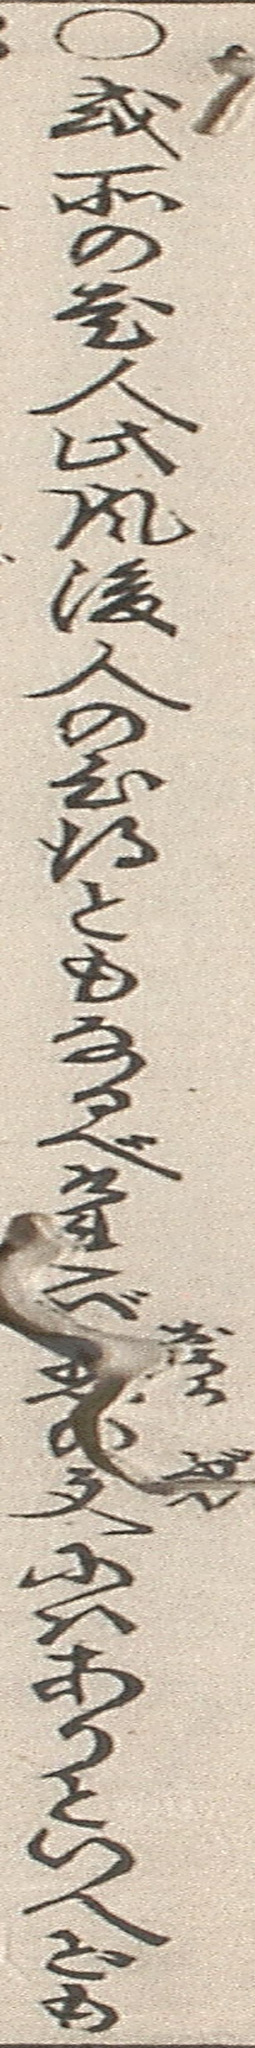◯或所の老人此風後人の心得ともなるべけれバ愚の文にハありといへども
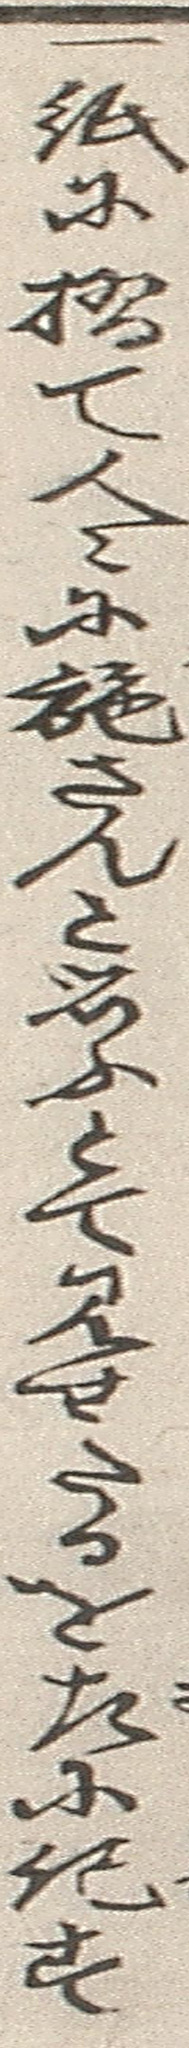一紙に摺て人々に施さんと思ふとて見せたるを左に記す
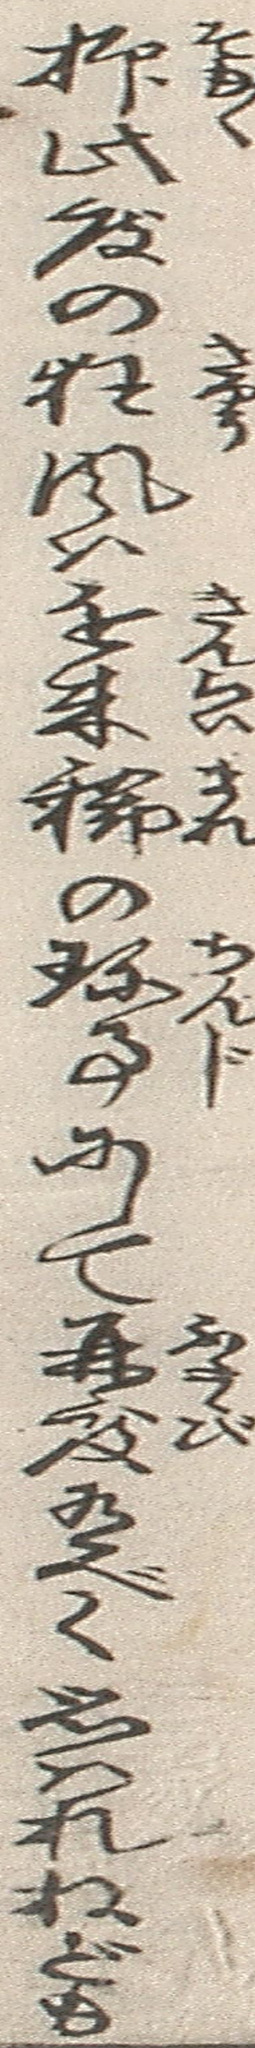抑此度の狂風ハ近来稀の珍事にて再度有べく思ハれねども
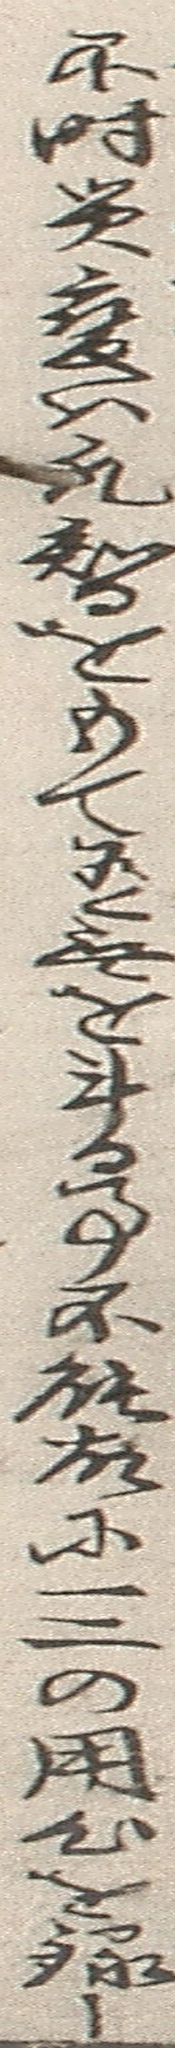不時災変は凡智をもて有無を斗る事不能故に一二の用心を録し
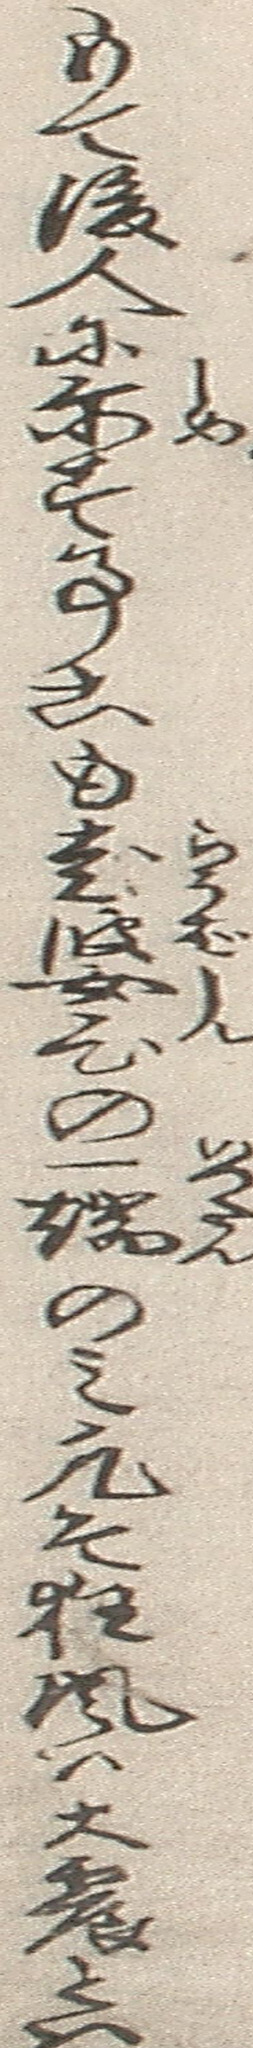もて後人に示す事こも老婆心の一端のミ凡そ狂風ハ大震とハ
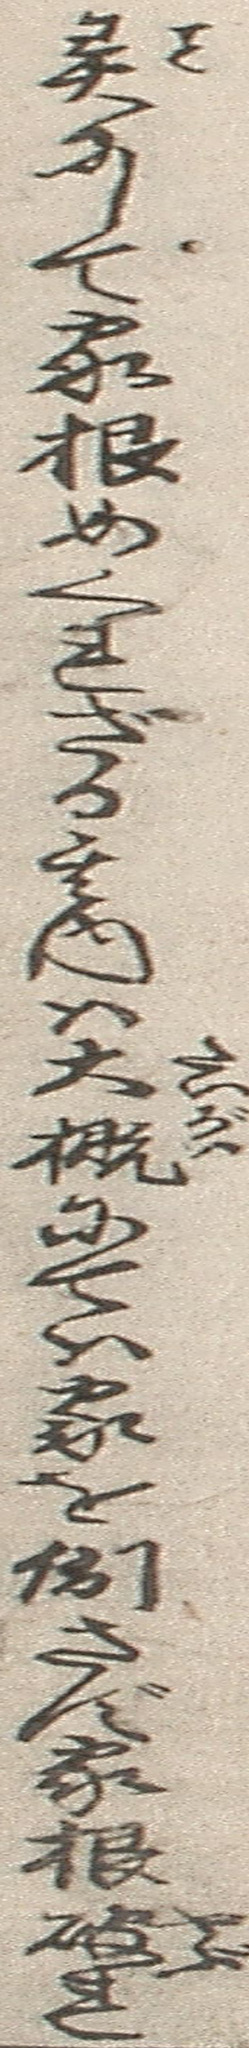異にて家根めくらざる其内ハ大概にてハ家を倒さず屋根破れ

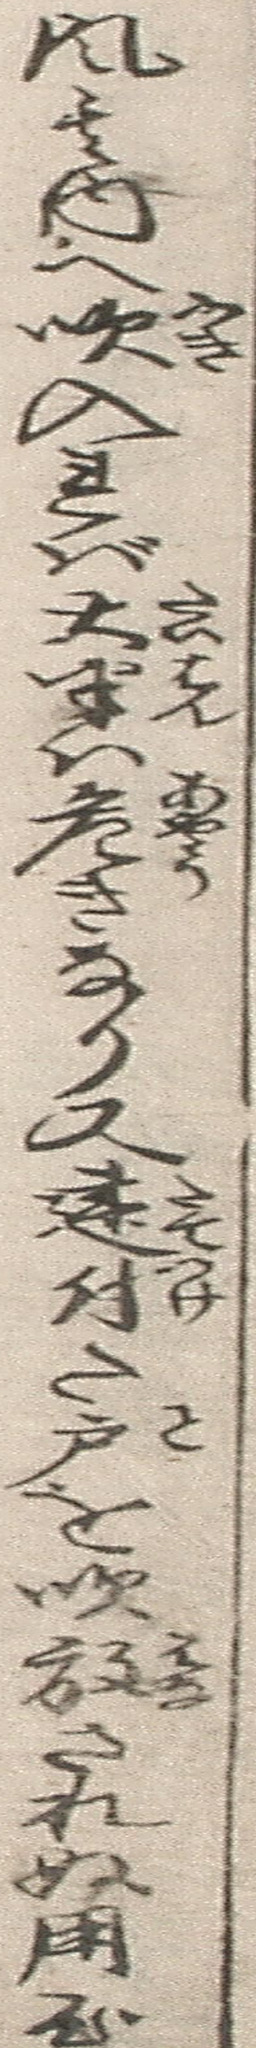風其内へ吹入れバ大半ハ危きなり又建付た戸を吹放されぬ用心
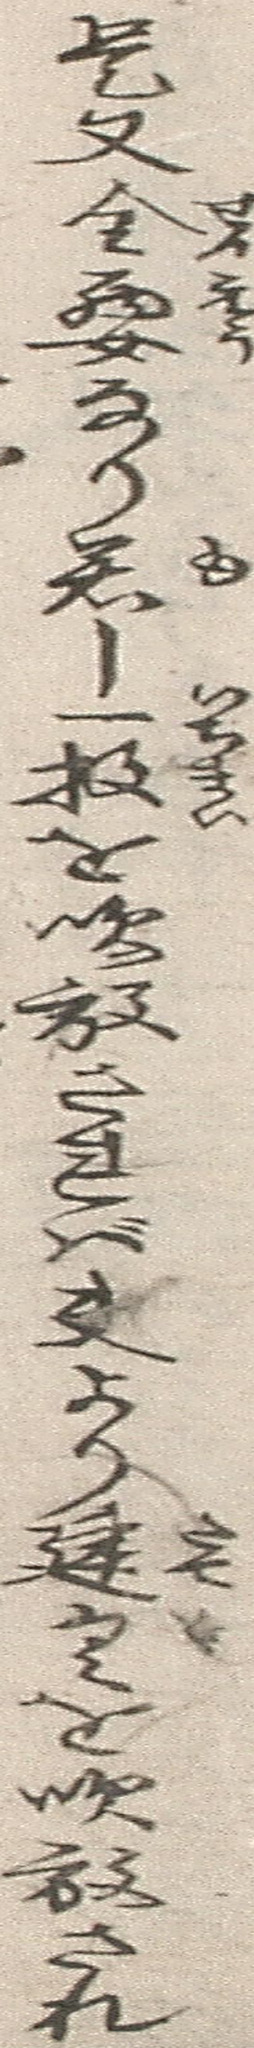是又全要成り若し一枚を吹放されバ夫より建具を吹放され
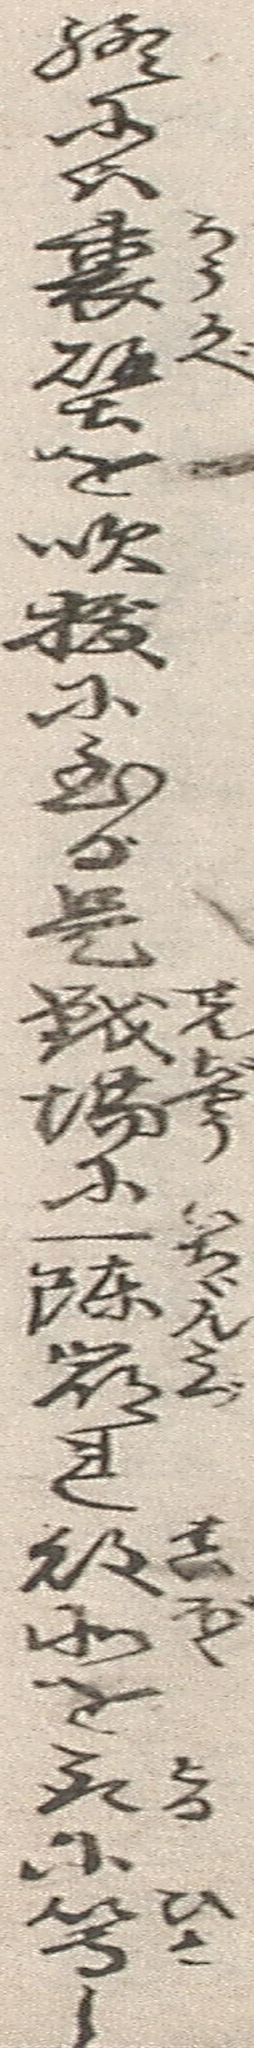終にハ裏壁を吹抜に至る是戦場に一陣崩れ敗北を取に等し
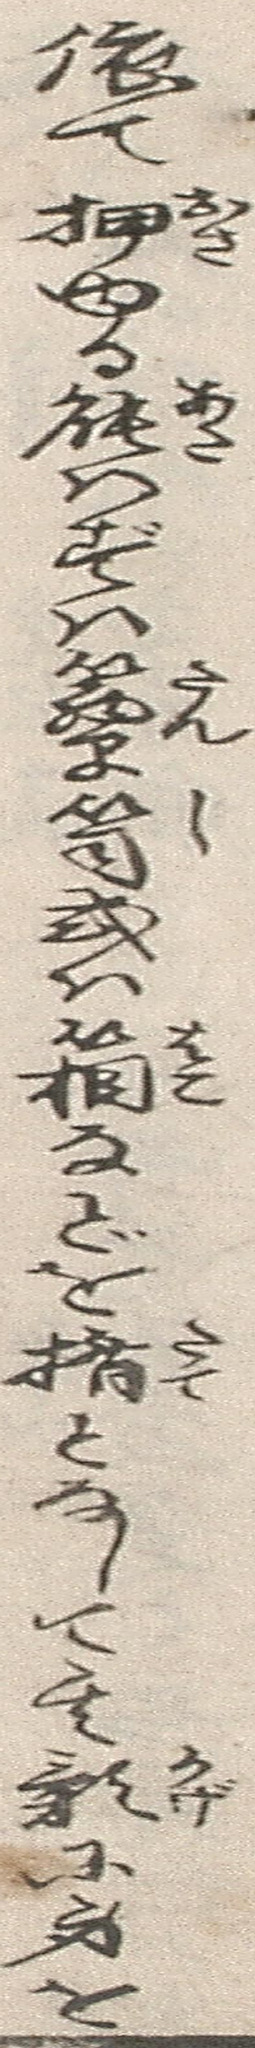依て押ゆる能ハずハ箪笥或ハ箱などを楯となして其影に身を
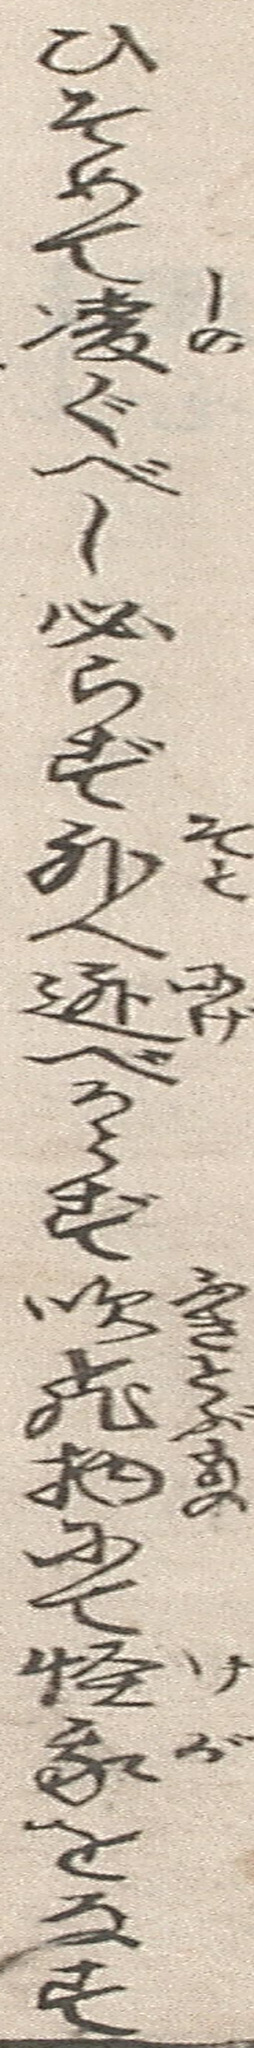ひそめて凌ぐべし必らず外へ逃べからず吹飛物にて怪我をなす
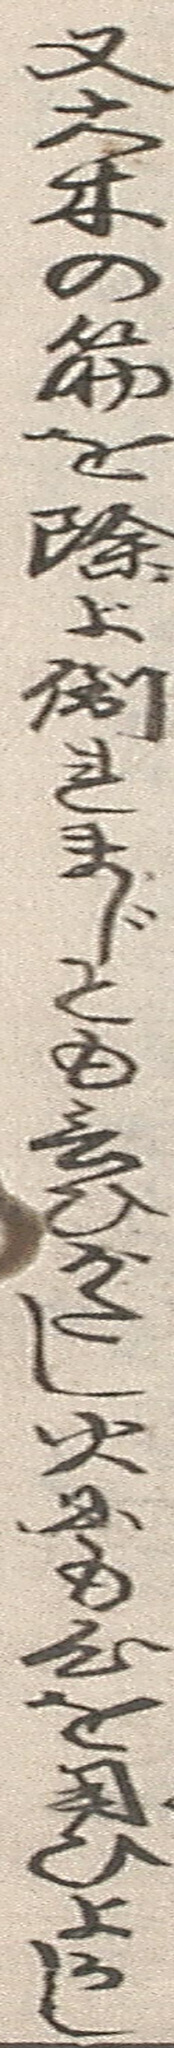又大木の筋を除よ倒れまじとも言ひかたし火にも心を用ひよろし
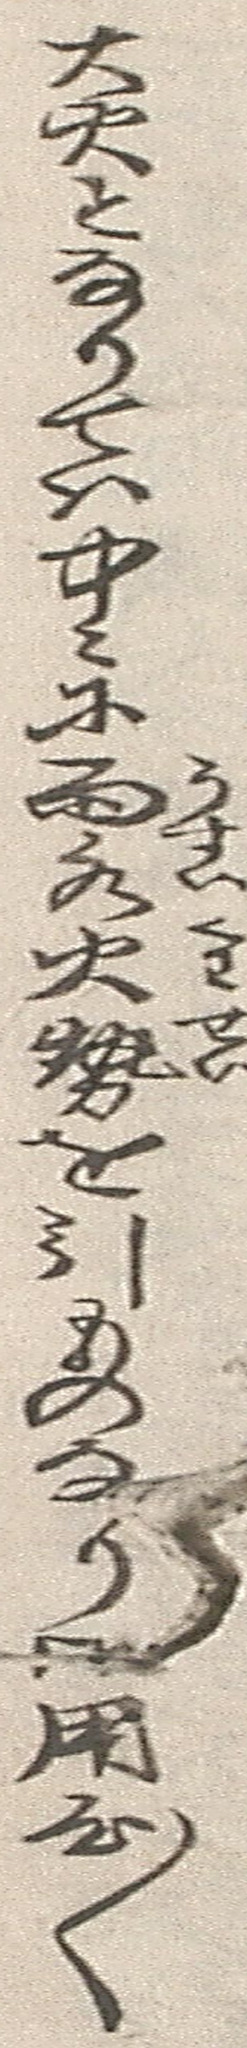大火となりてハ中々に雨水火勢を引ものなり用心〳〵
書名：安政風聞集　上中下　全
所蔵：東京大学地震研究所図書室 Earthquake Research Institute Library, The University of Tokyo, JAPAN
